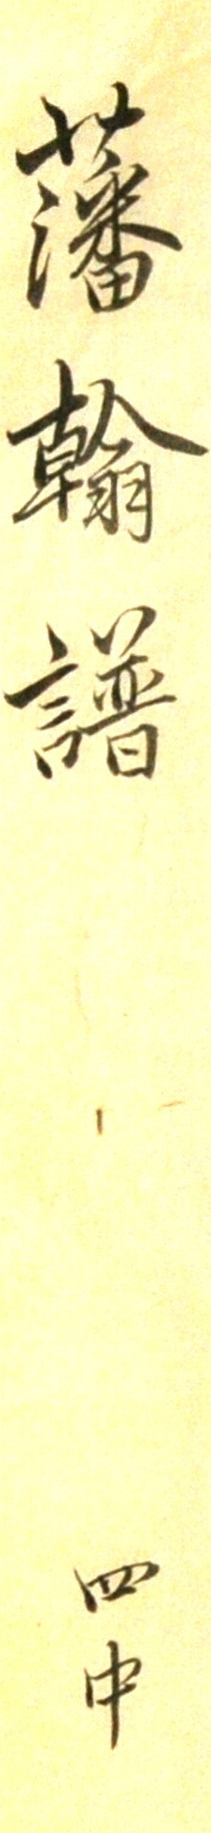藩翰譜四中

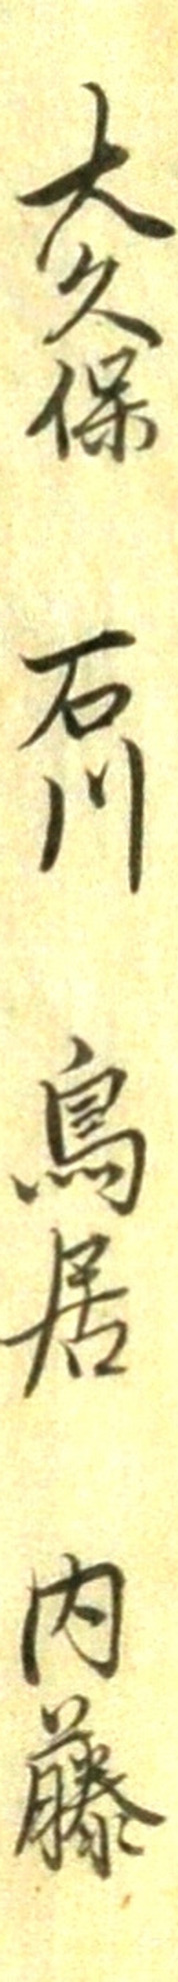大久保石川鳥居内藤
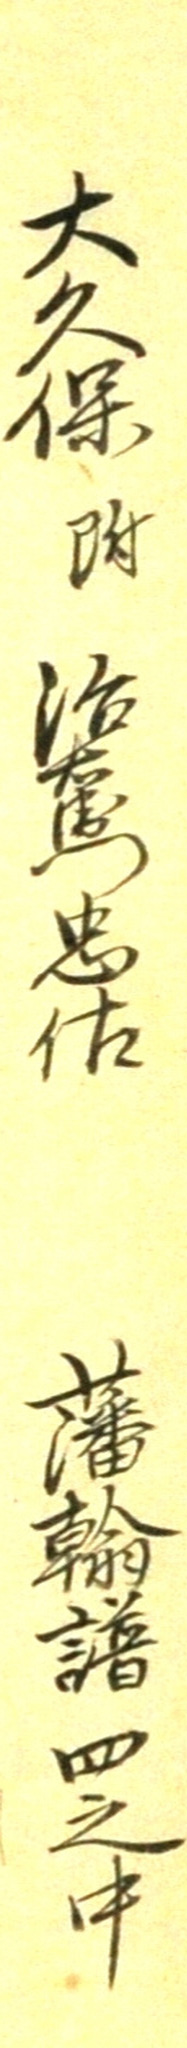大久保付治右衛門忠佐藩翰譜四之中
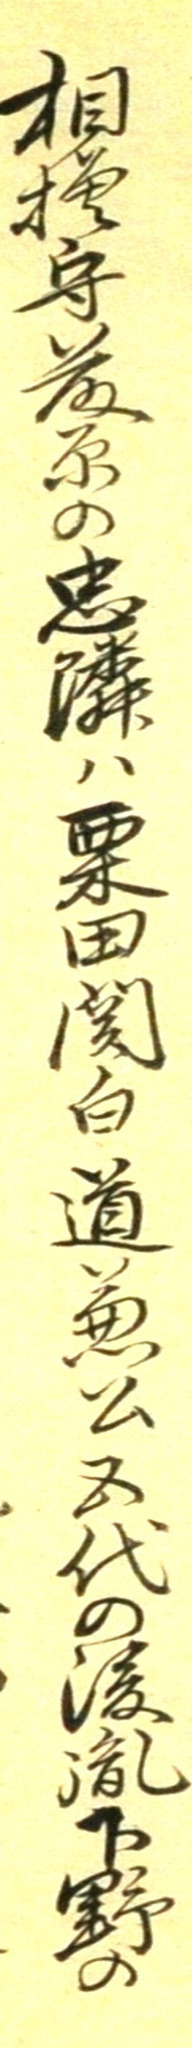相模守藤原の忠隣は栗田関白道兼公五代の後胤下野の
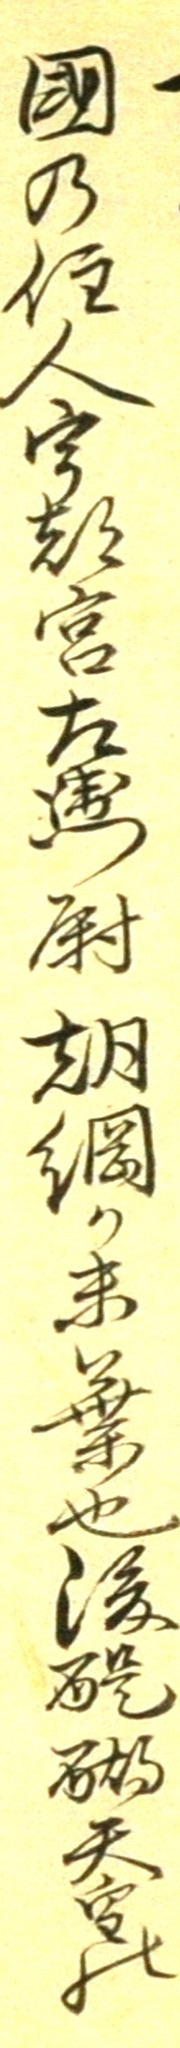国乃住人宇都宮左衛門尉朝綱か末葉也後醍醐天皇の
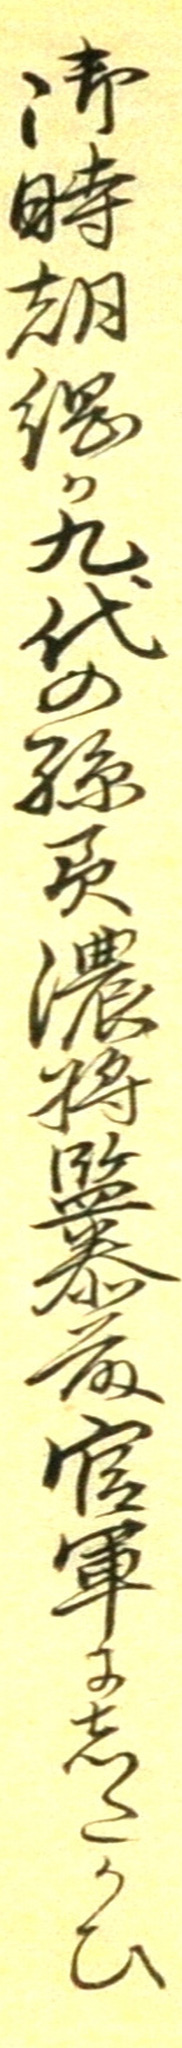御時朝綱か九代の孫美濃将監泰藤官軍にしたかひ
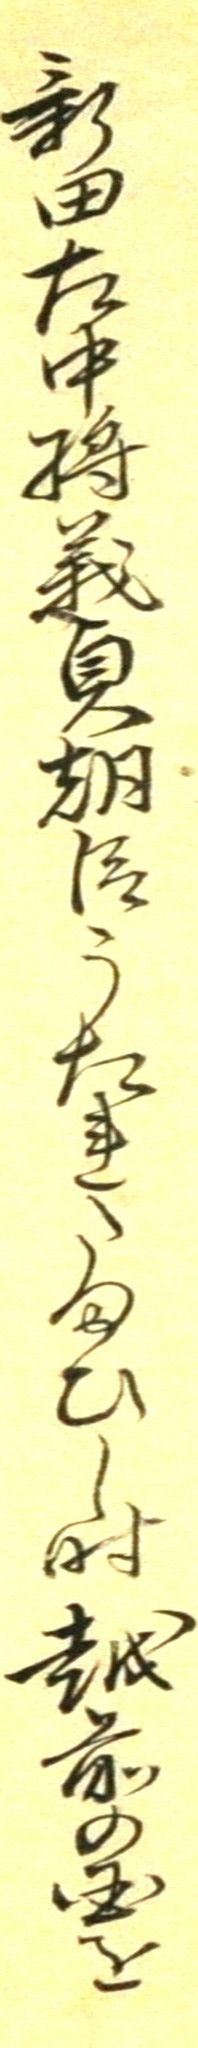新田左中将義貞朝臣うたれたまひし時越前の国を
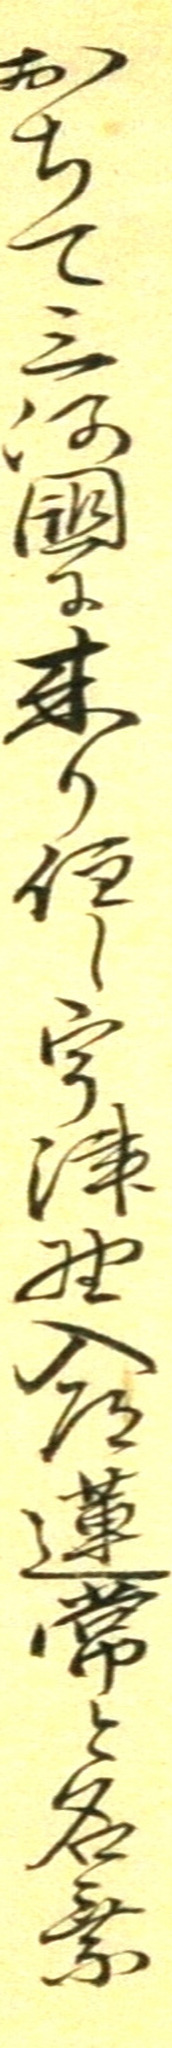おちて三河国に来り住し宇津野入道蓮常と名乗
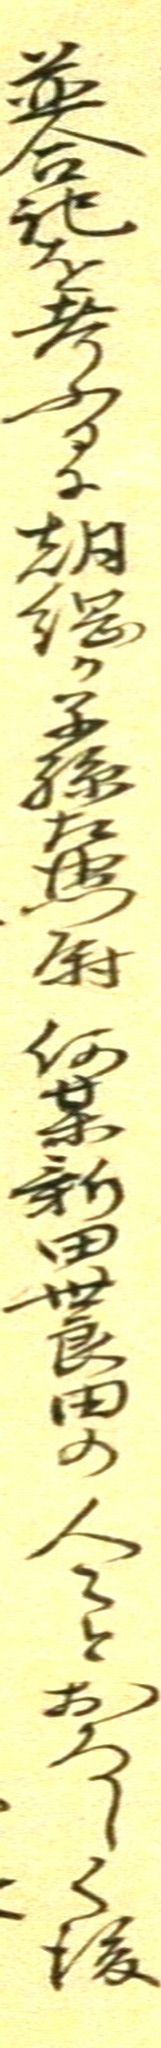並合記を考ふるに朝綱か子孫左衛門尉何某新田世良田の人々とおなしく後
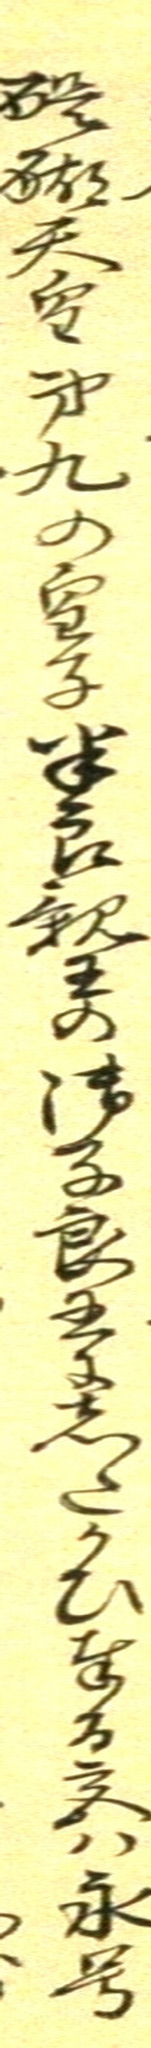醍醐天皇第九の皇子半良親王の御子良王にしたかひ奉る宮は永号
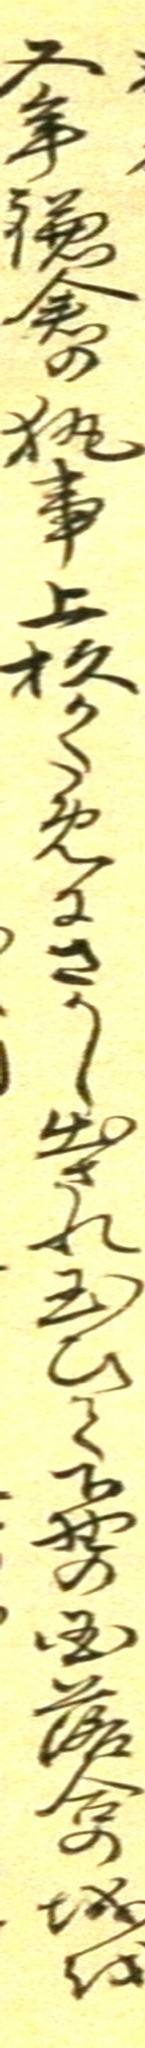五年鎌倉の執事上杉かためにさかし出され玉ひて下野の国落合の城を
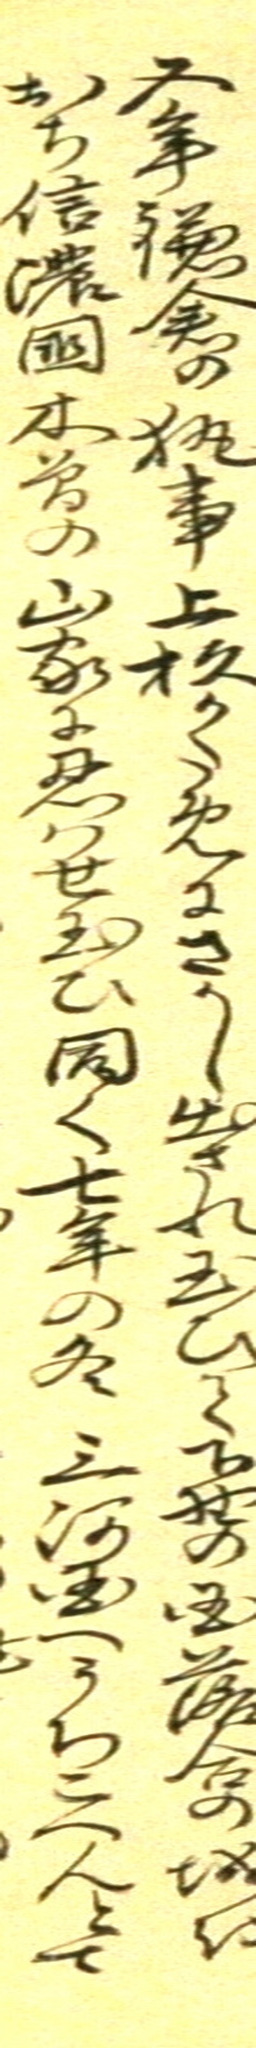おち信濃国木曽の山家に忍はせ玉ひ同く七年の冬三河国へうちこへんとて
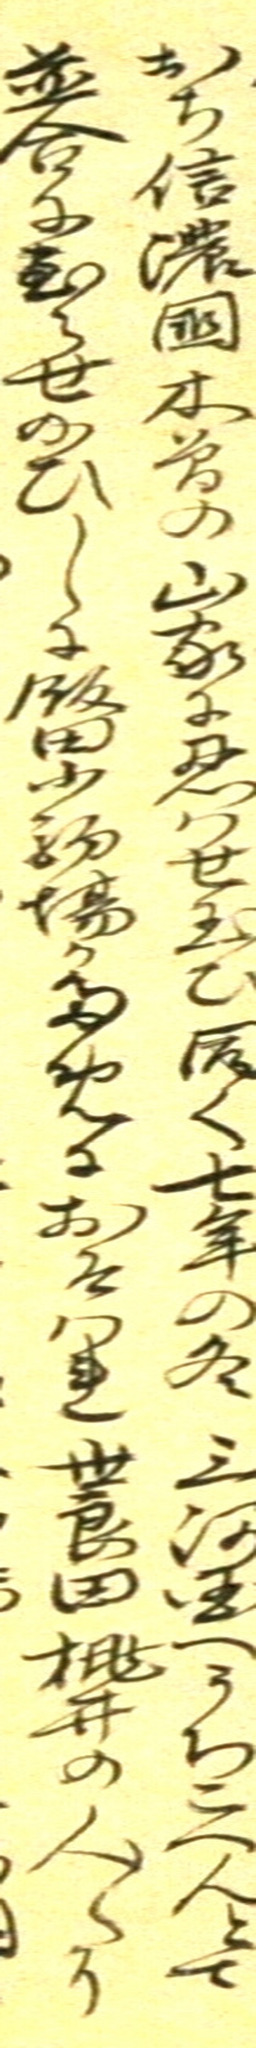並合に至らせ給ひしに飯田小駒場かためにおそわれ世良田桃井の人〳〵に
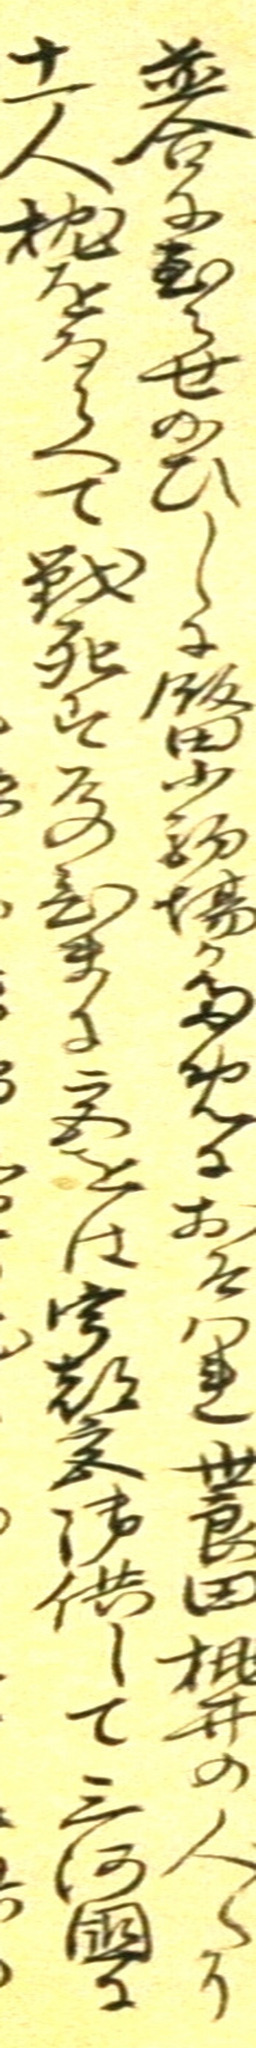十一人枕をならへて戦死すそのひまに宮をは宇都宮御供して三河国に
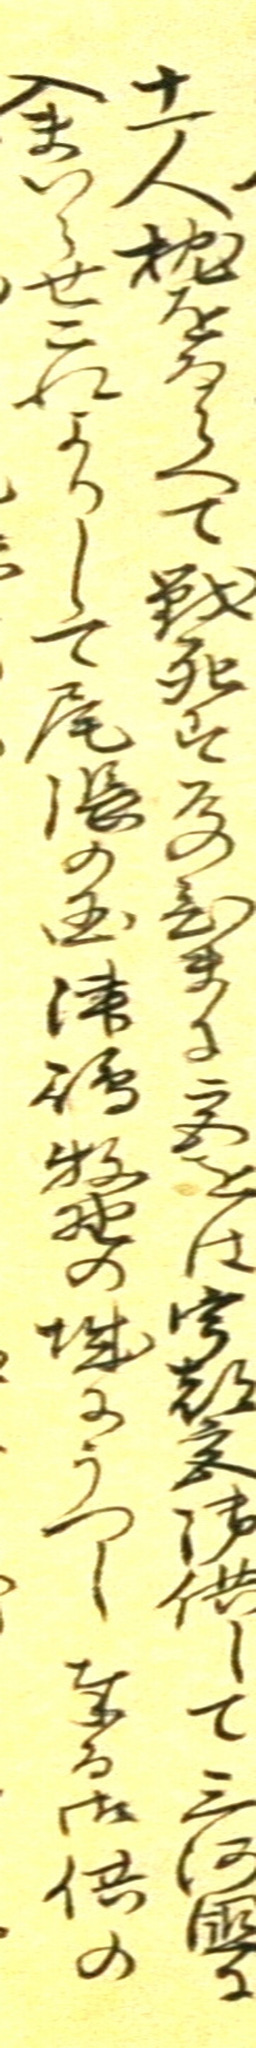入まいらせこれよりして尾張の国津島牧野の城にうつし奉る御供の
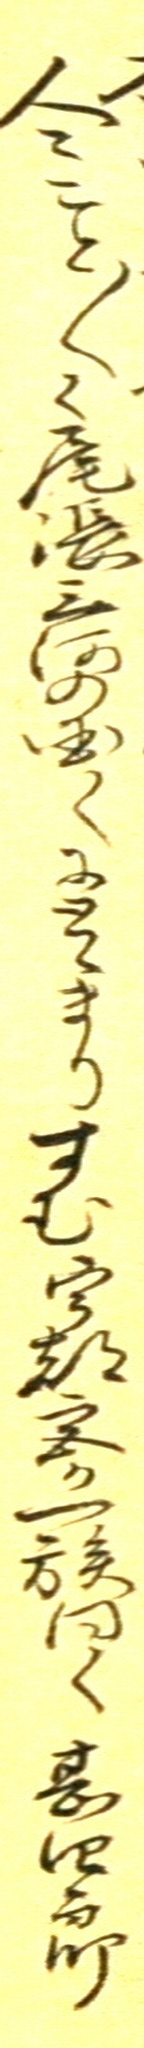人々こと〳〵く尾張三河の国〳〵にととまりすむ宇都宮か一族同く甚四郎
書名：藩翰譜（四・中）
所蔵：伊那市立高遠町図書館・合同会社AMANE
